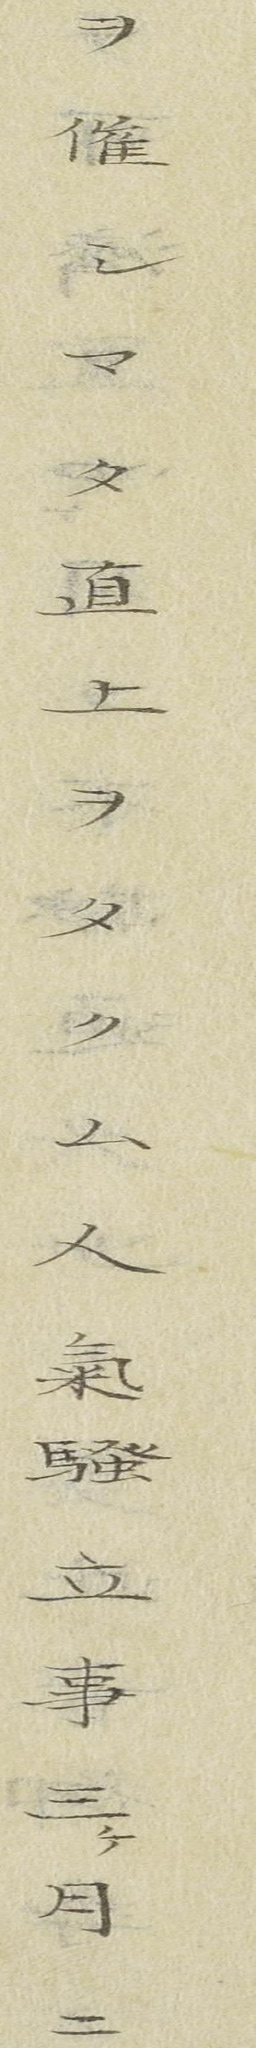ヲ催シマタ値上ヲタクム人気騷立事三ヶ月ニ

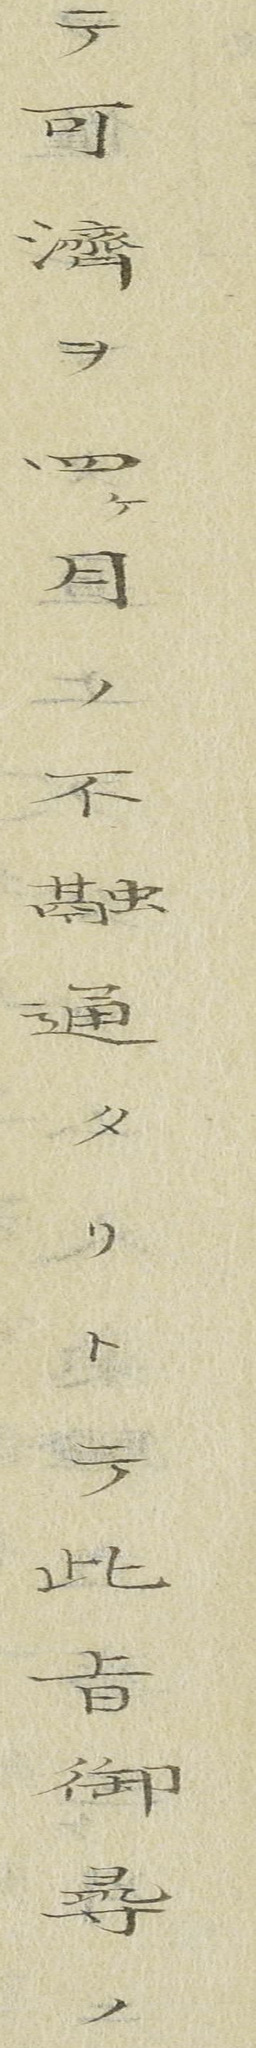テ可済ヲ四ヶ月ノ不融通タリトテ此旨御尋ノ
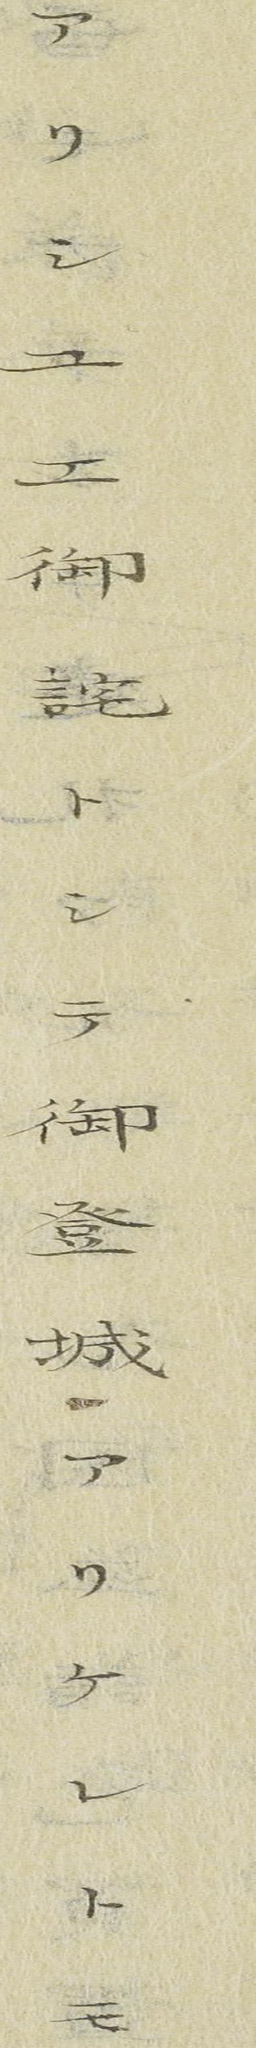アリシユエ御詫トシテ御登城アリケレトモ
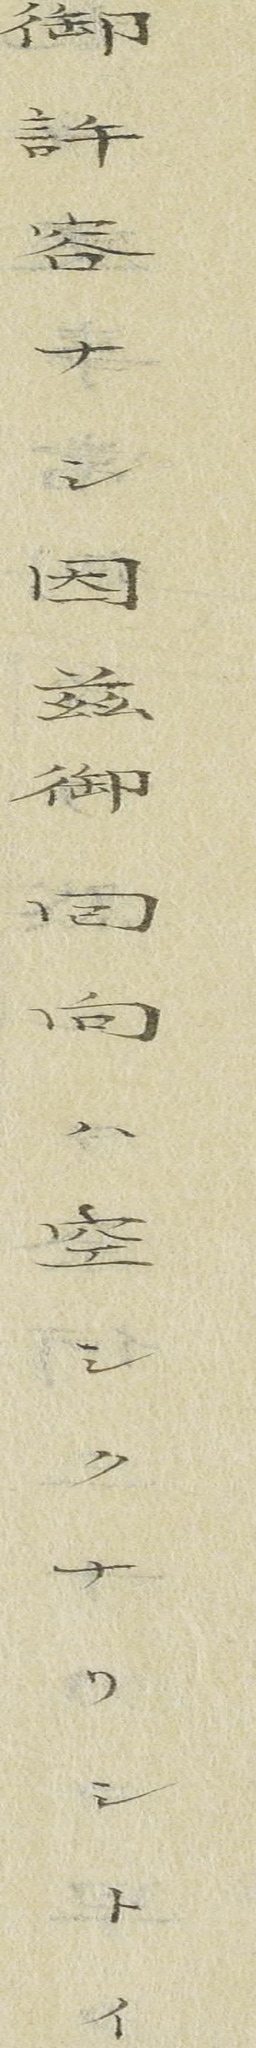御許容ナシ因茲御回向ハ空シクナリシトイ
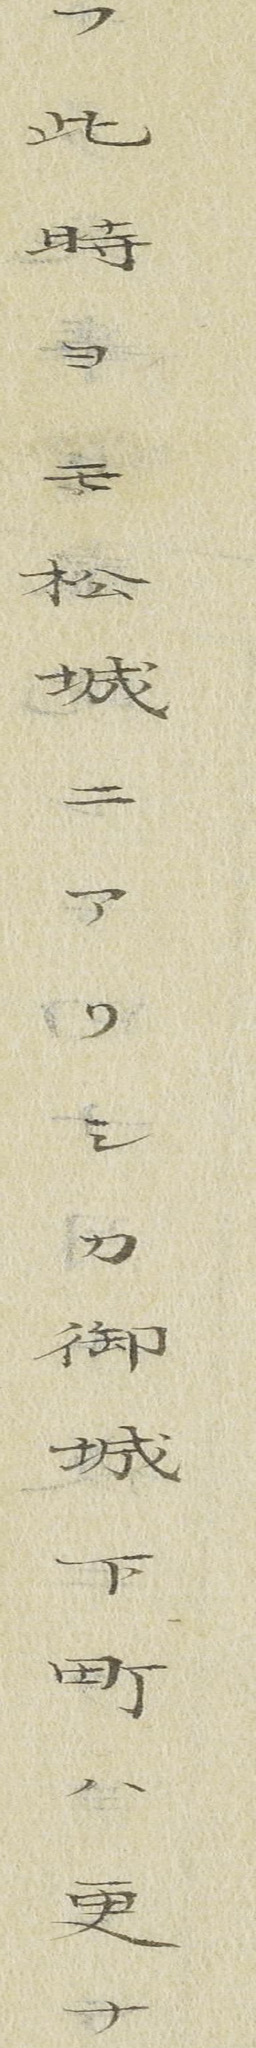フ此時ヨモ松城ニアリシカ御城下町ハ更ナ
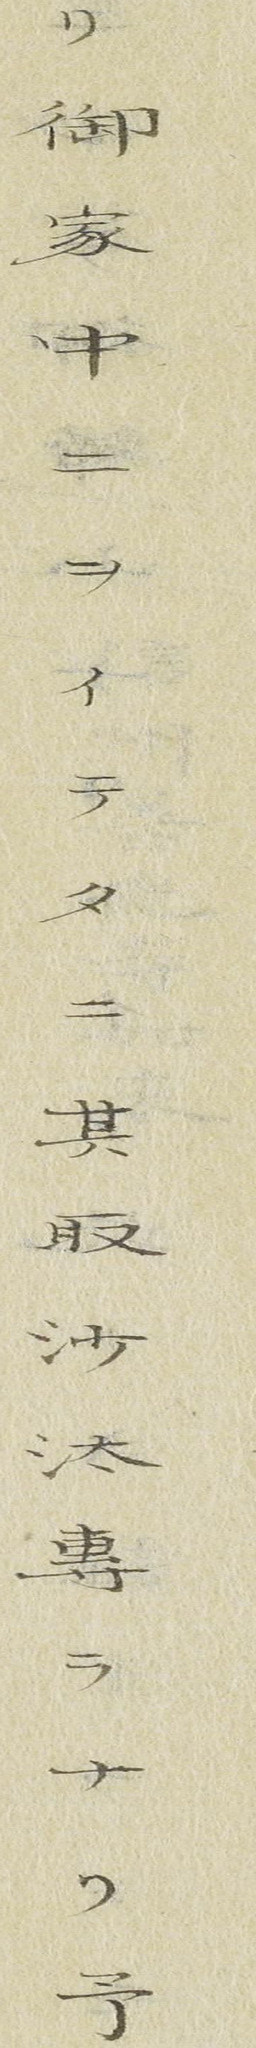リ御家中ニヲイテタニ其取沙汰専ラナリ予
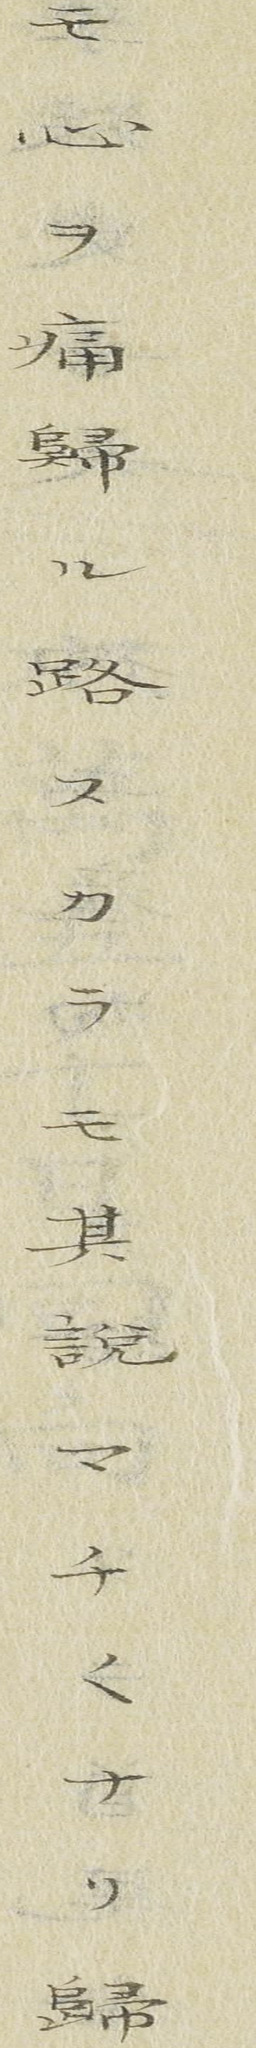モ心ヲ痛帰ル路スカラモ其説マチ〱ナリ帰
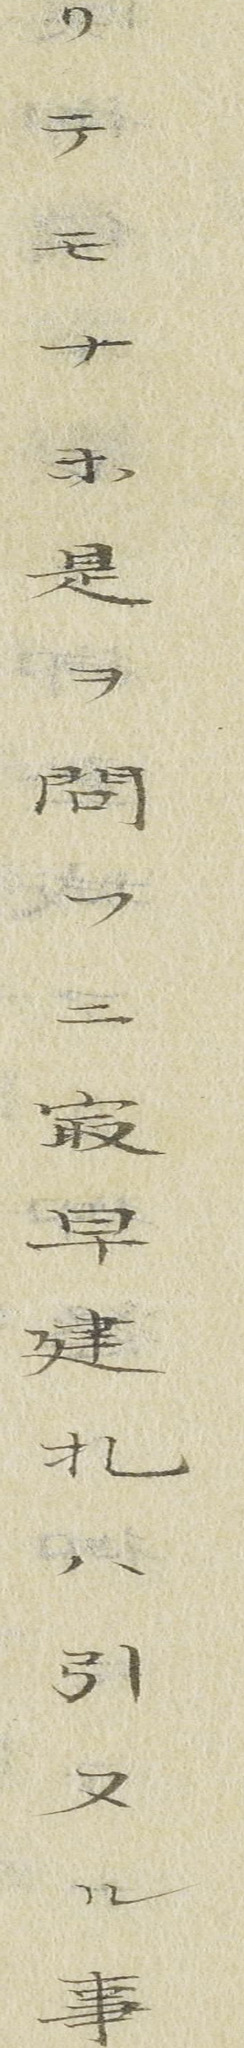リテモナホ是ヲ問フニ最早建札ハ引ヌル事
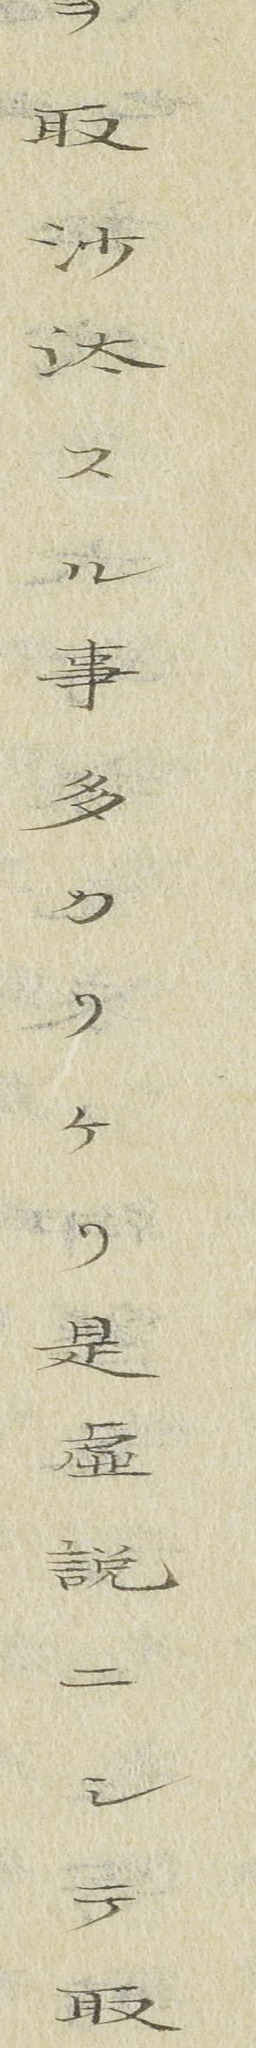ヲ取沙汰スル事多カリケリ是虚説ニシテ取
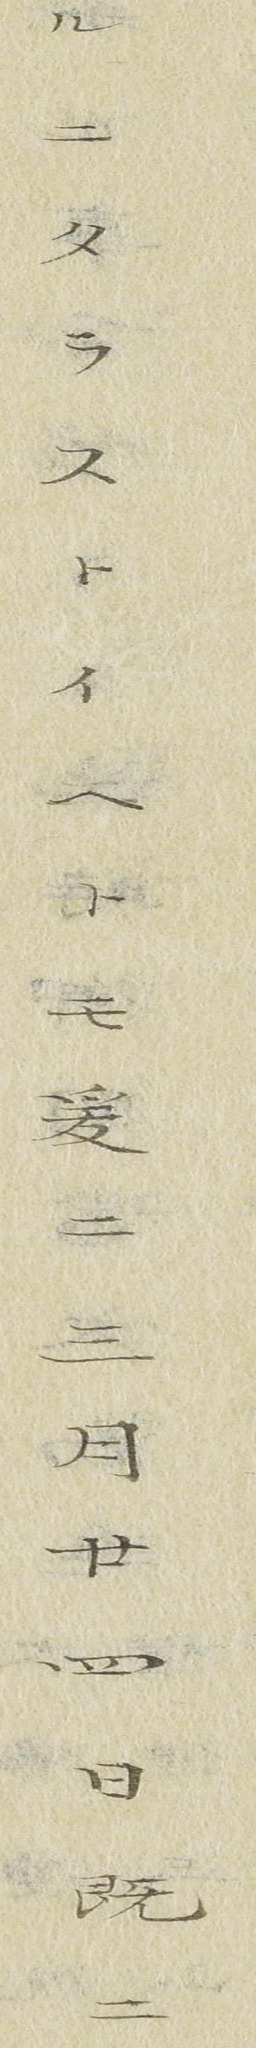ルニタラストイヘトモ爰ニ三月廿四日既ニ
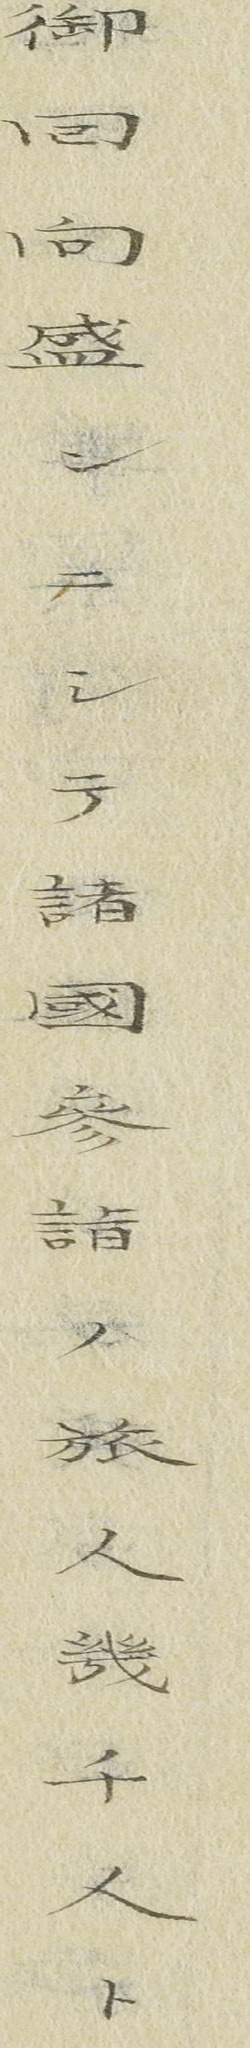御回向盛ンニシテ諸国参詣ノ旅人幾千人ト
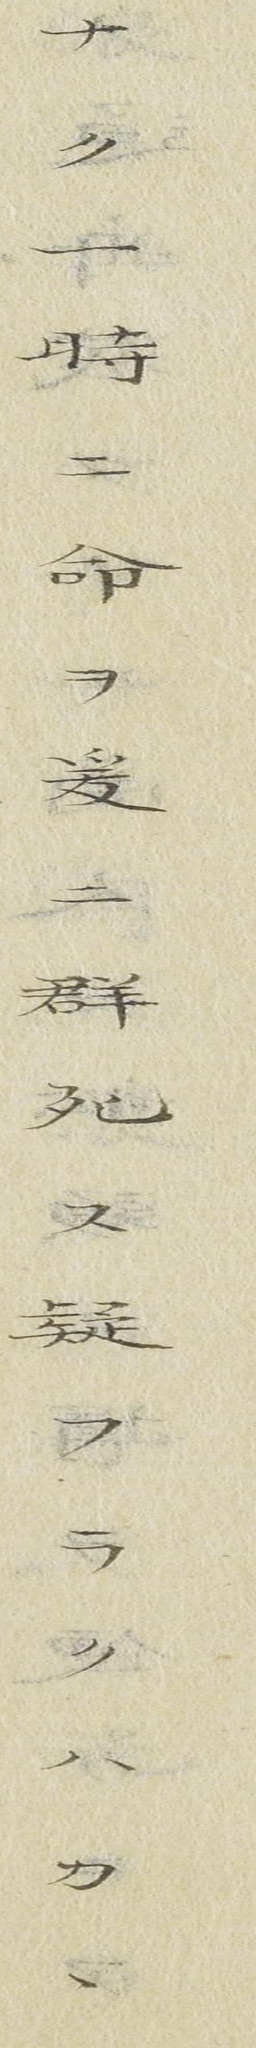ナク一時ニ命ヲ爰ニ群死ス疑フラクハカヽ
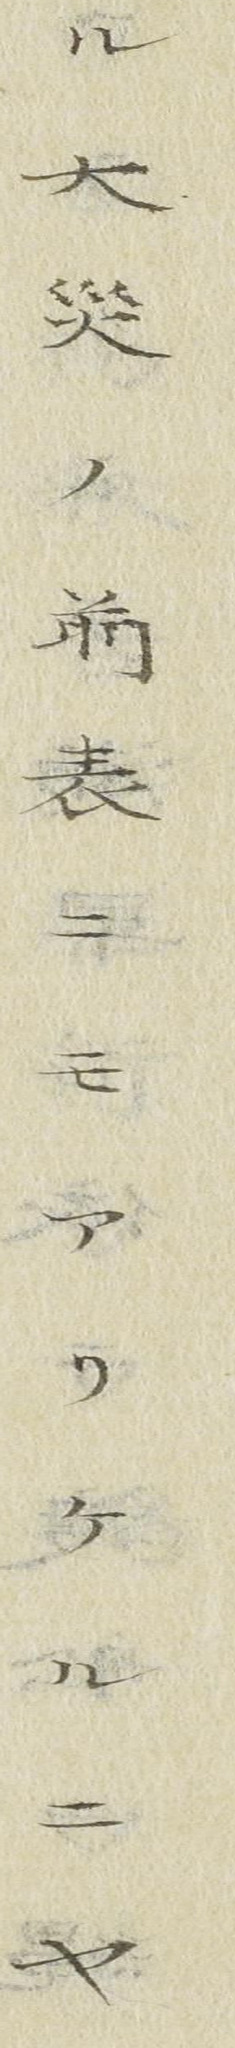ル大災ノ前表ニモアリケルニヤ
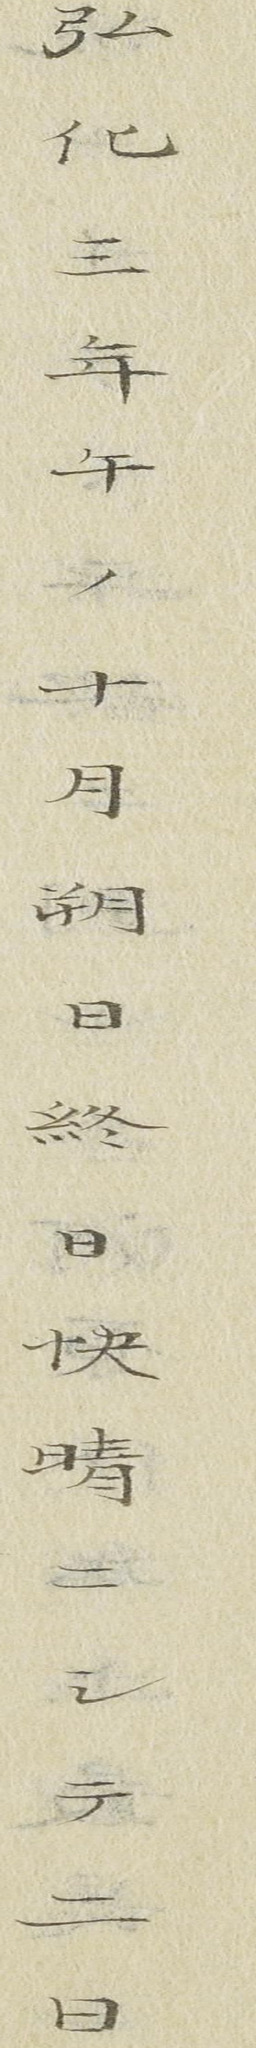弘化三年午ノ十月朔日終日快晴ニシテ二日
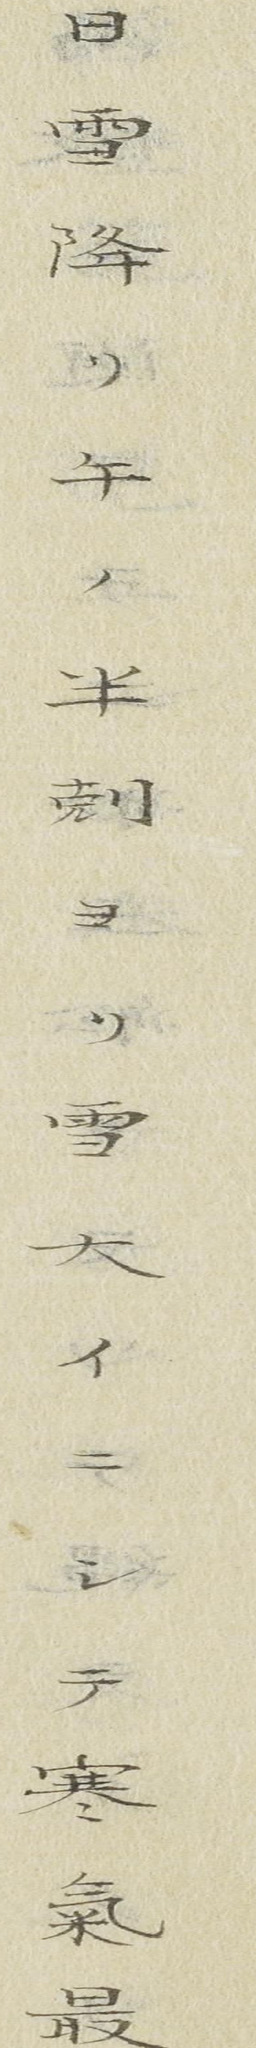日雪降リ午ノ半刻ヨリ雪大イニシテ寒気最
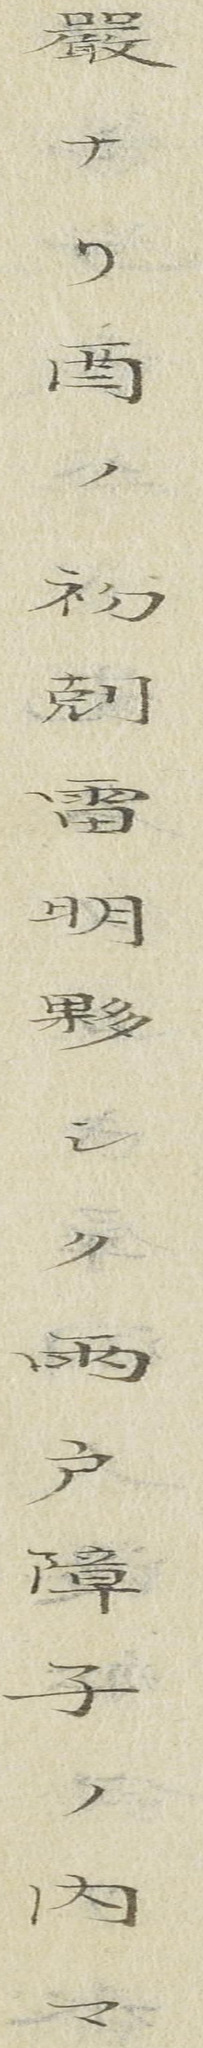厳ナリ酉ノ初刻雷明夥シク雨戸障子ノ内マ
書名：地災撮要　地震之部　巻ノ二
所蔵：東京大学地震研究所図書室 Earthquake Research Institute Library, The University of Tokyo, JAPAN
